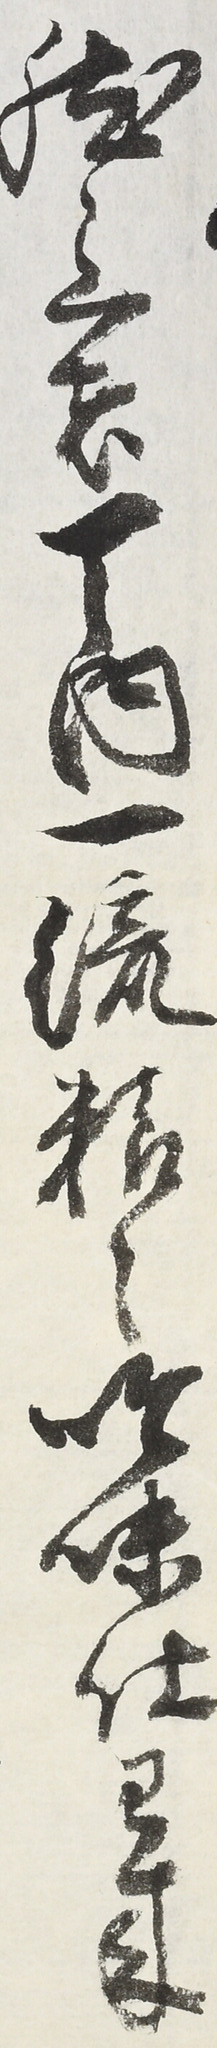然上者丁内一統精々吟味仕已来
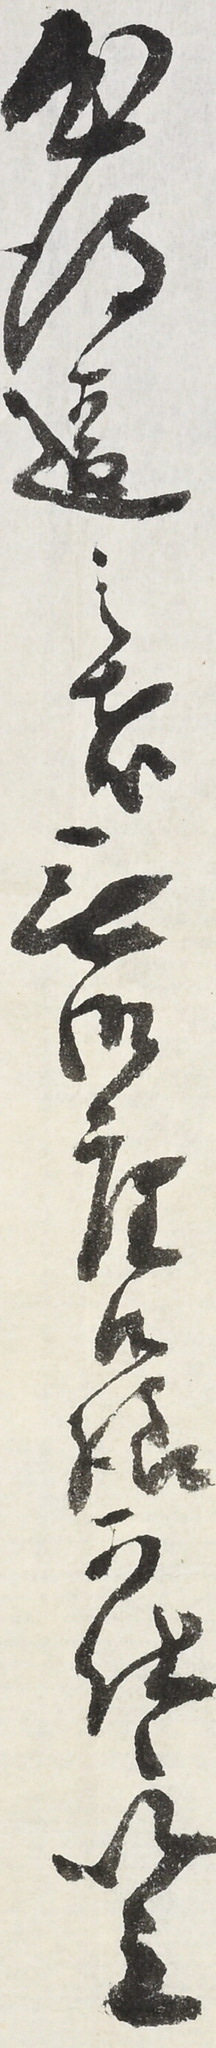心得違之者無御座候様可仕候以上
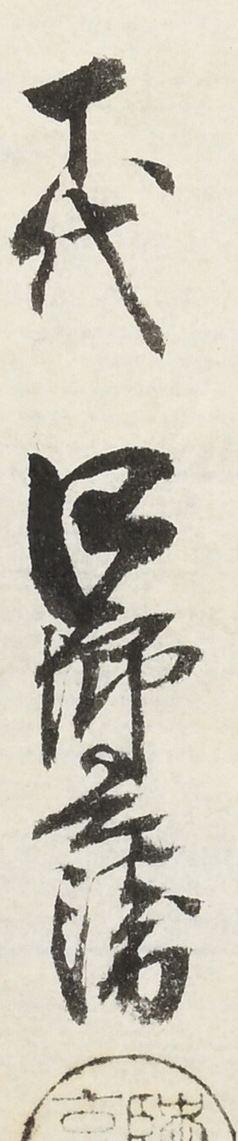丁代四郎兵衛㊞
